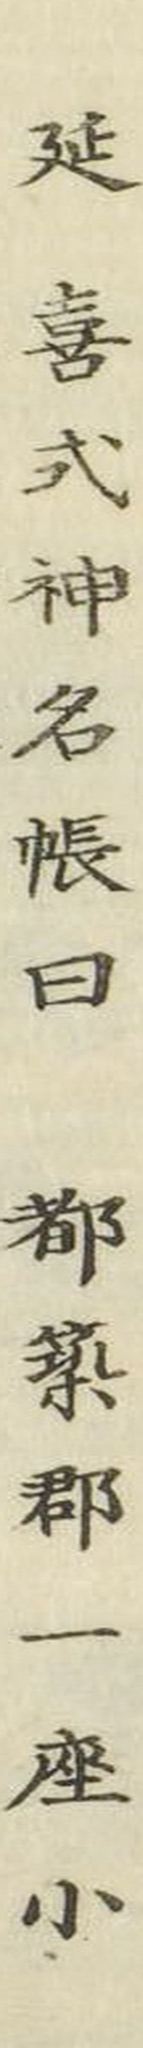延喜式神名帳曰都築郡一座小
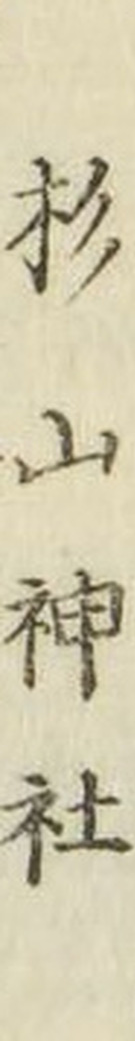杉山神社
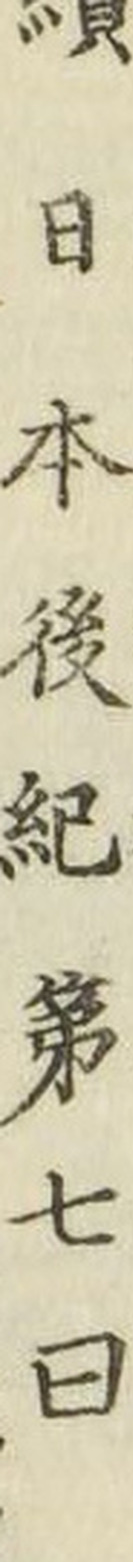續日本後紀第七曰
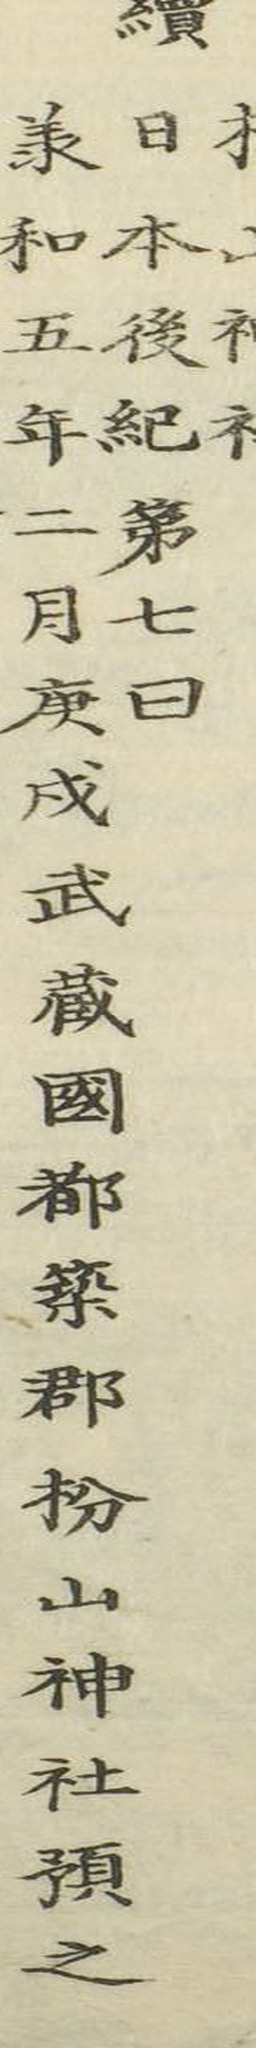承和五年二月庚戌武蔵國都築郡枌山神社預之
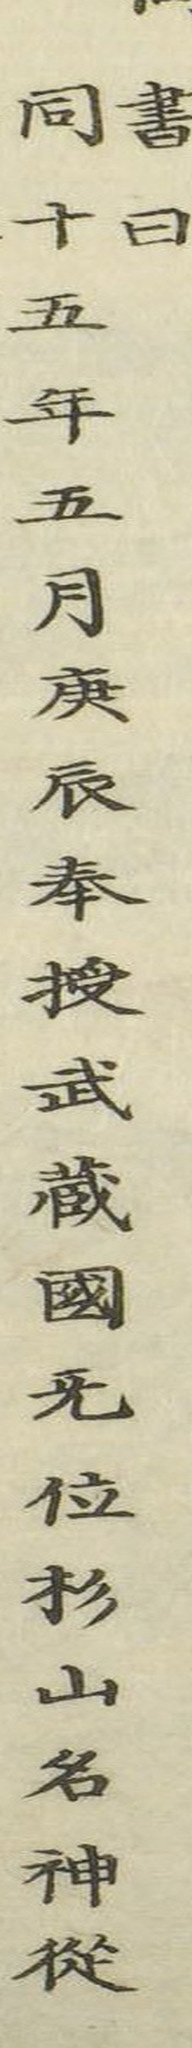同十五年五月庚辰奉授武蔵國⺛位杉山名神從
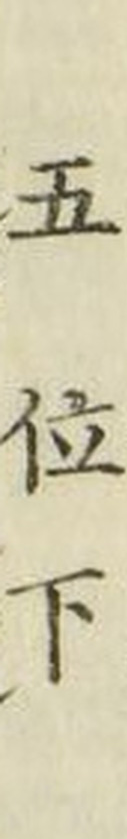五位下
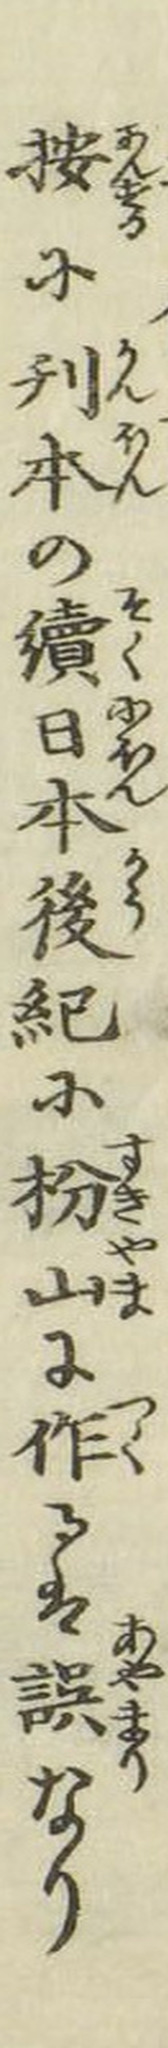按に刋本の續日本後紀に枌山に作るは誤なり

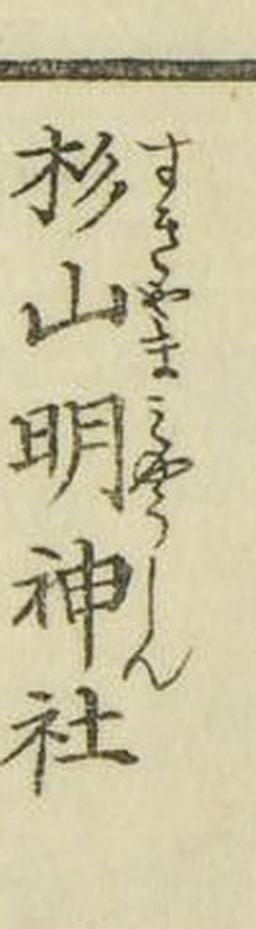杉山明神社
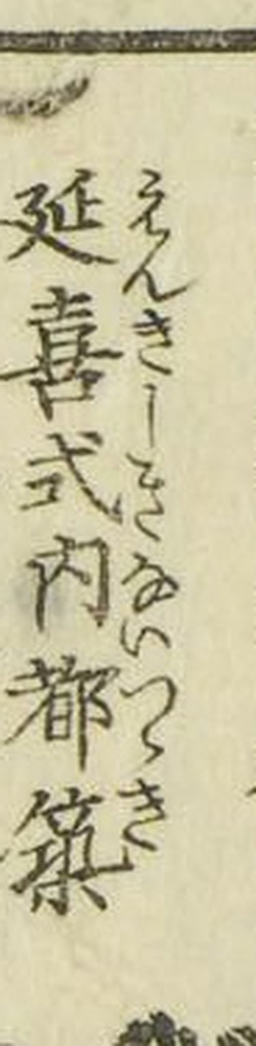延喜式内都築
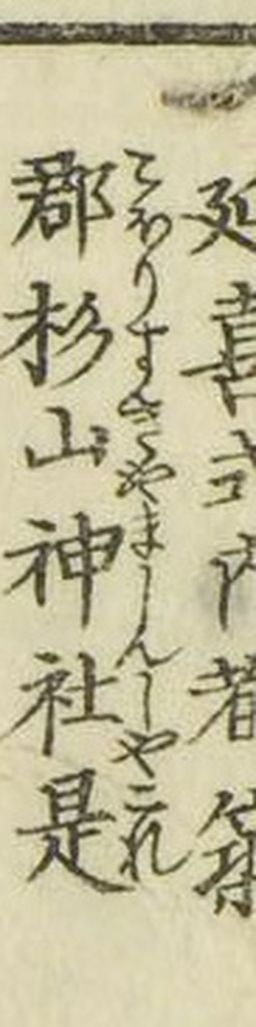郡杉山神社是
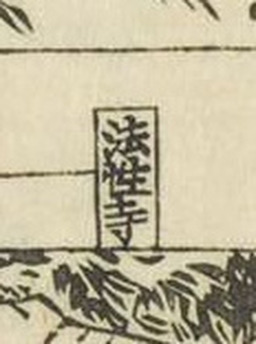法性寺
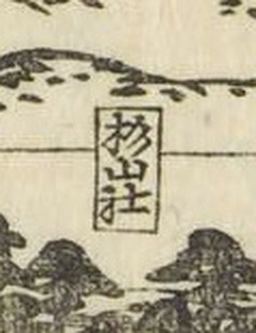杉山社

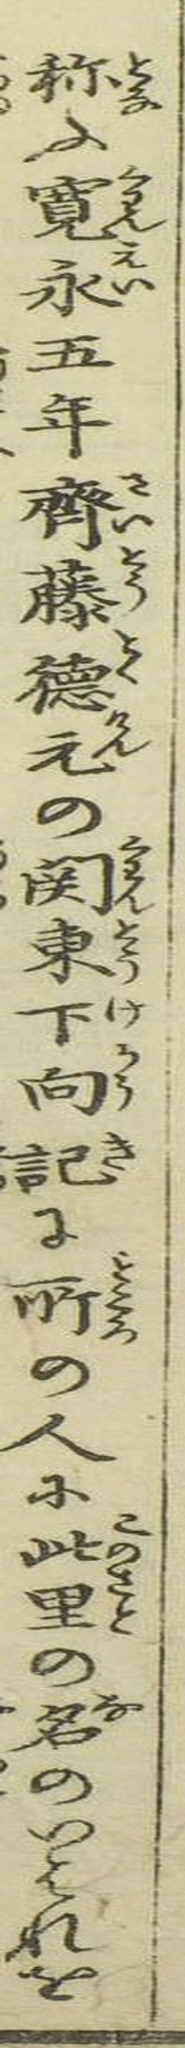称ふ寛永五年齊藤德元の関東下向記に所の人に此里の名のいはれを
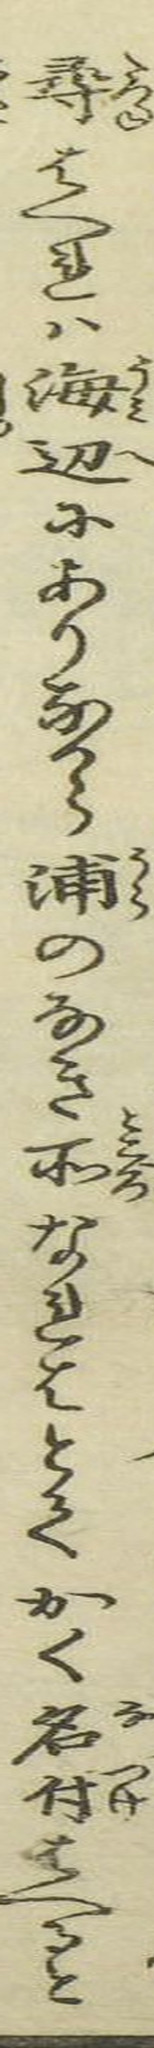尋はへれは海辺にありなから浦のなき所なれはとてかく名付はへると
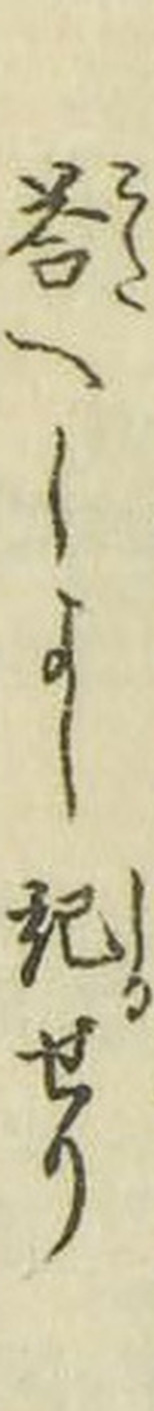荅へしよし記せり
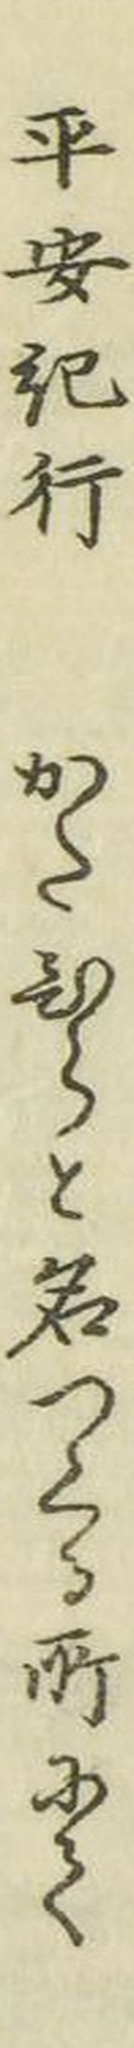平安紀行かたひらと名つくる所にて
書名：江戸名所図会 20巻 巻之6
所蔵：東京学芸大学教育コンテンツアーカイブ
